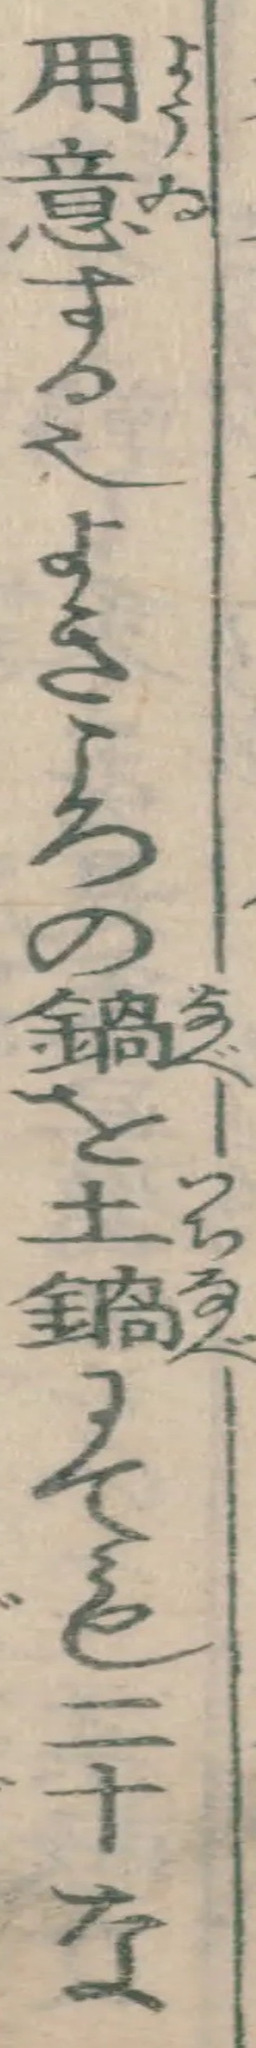用意する也よきころの鍋を土鍋にても二十な
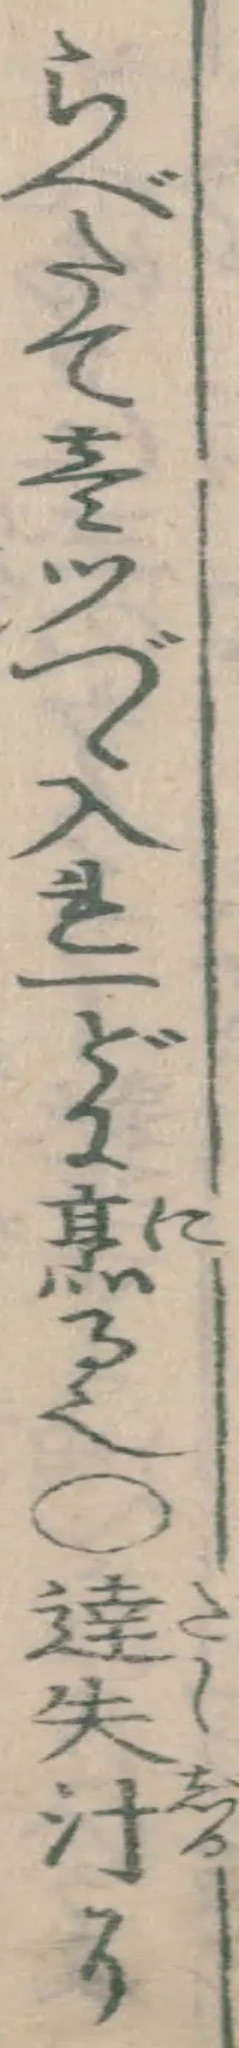らべたて壱つづゝ入れ一どに烹る也○達失汁に
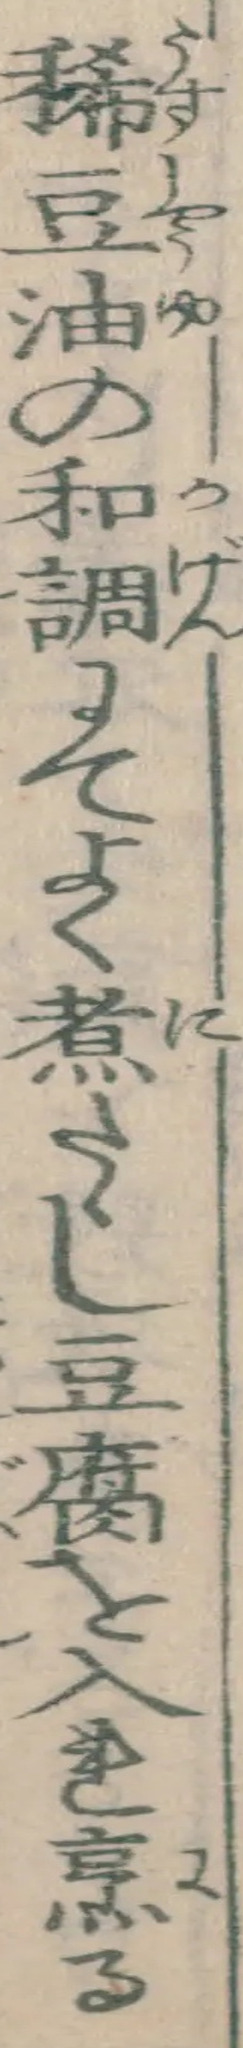稀豆油の和調にてよく煮たゝし豆腐を入れ烹る
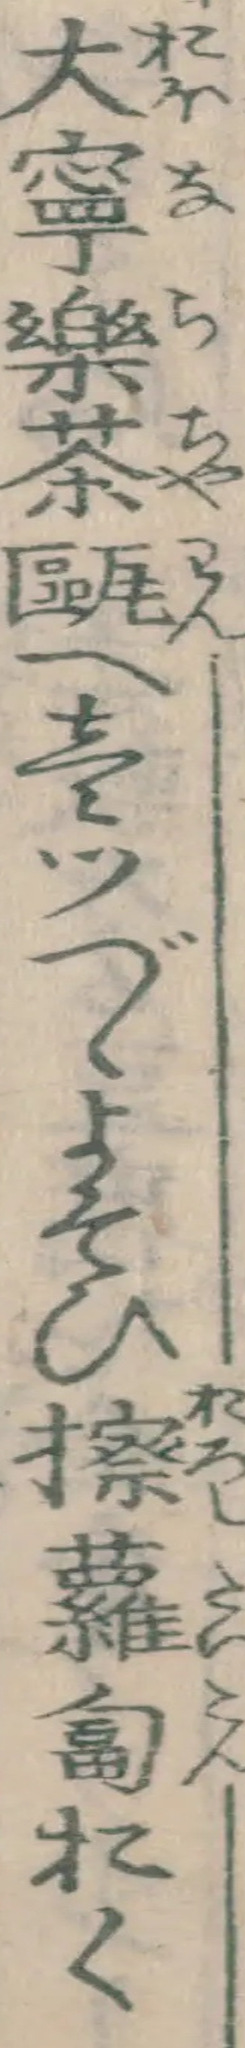大寧楽茶甌へ壱つづゝよそひ擦蘿蔔おく
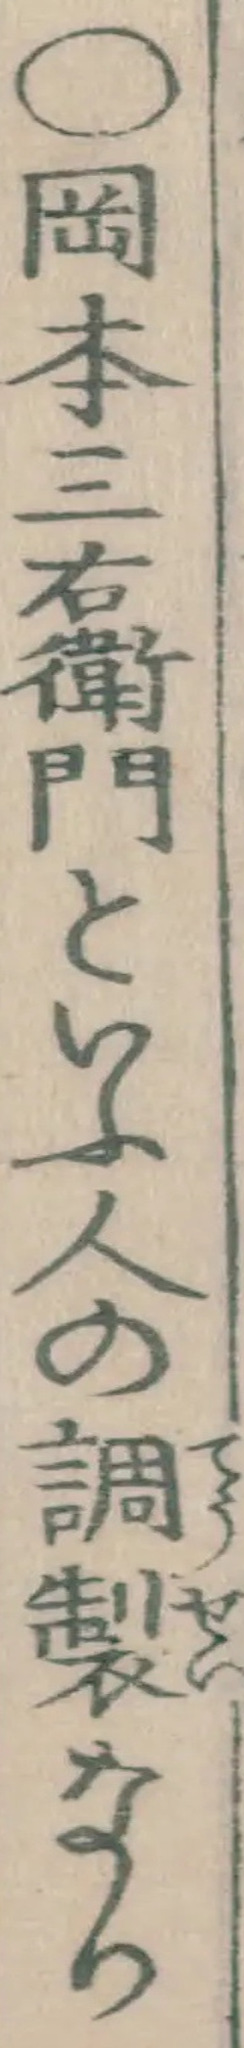○岡本三右衛門といふ人の調製なり
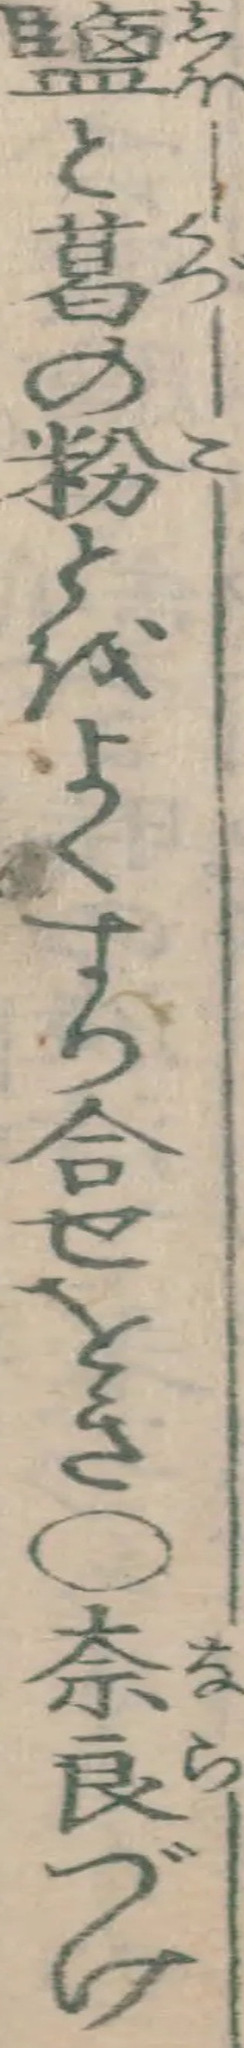塩と葛の粉とをよくすり合せをき○奈良づけ
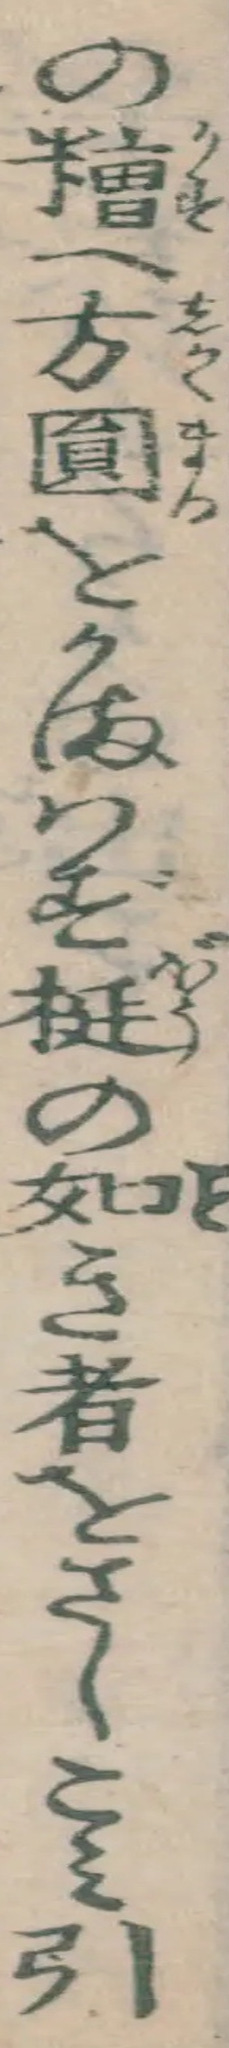の糟へ方円をかまはず梃の如き者をさしこみ引
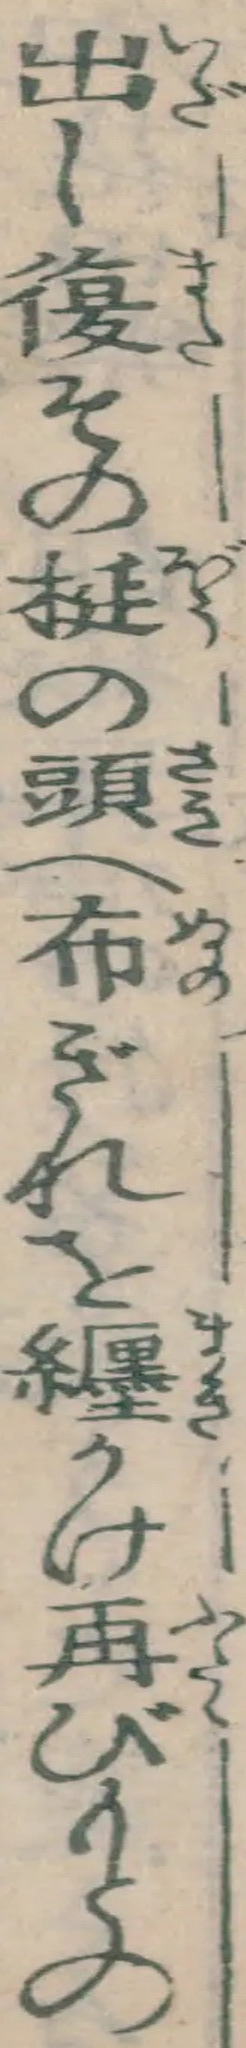出し復その梃の頭へ布ぎれを纏かけ再びもとの
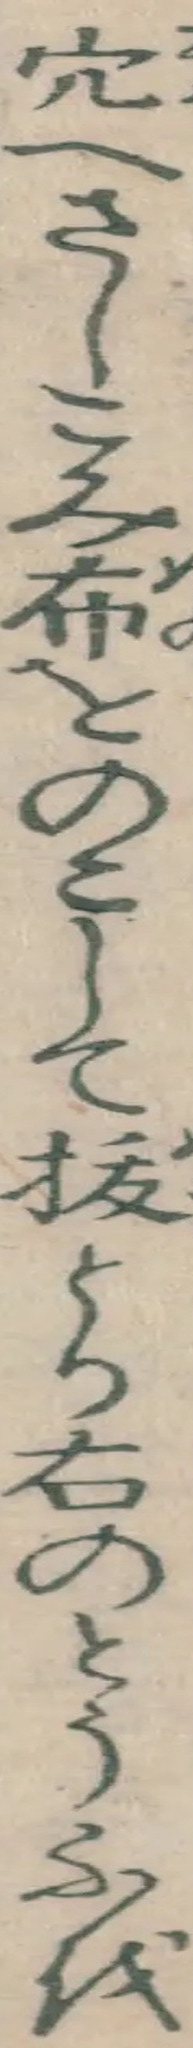穴へさしこみ布をのこして抜とり右のとうふを
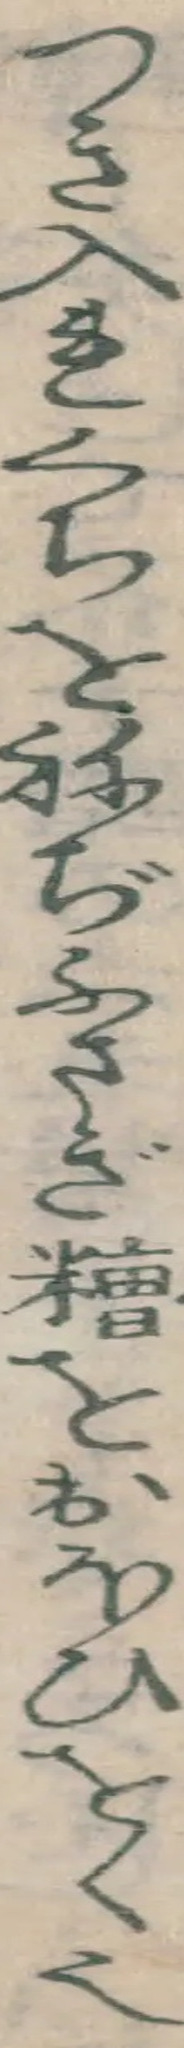つき入れくちをねぢふさぎ糟をおほひをく也
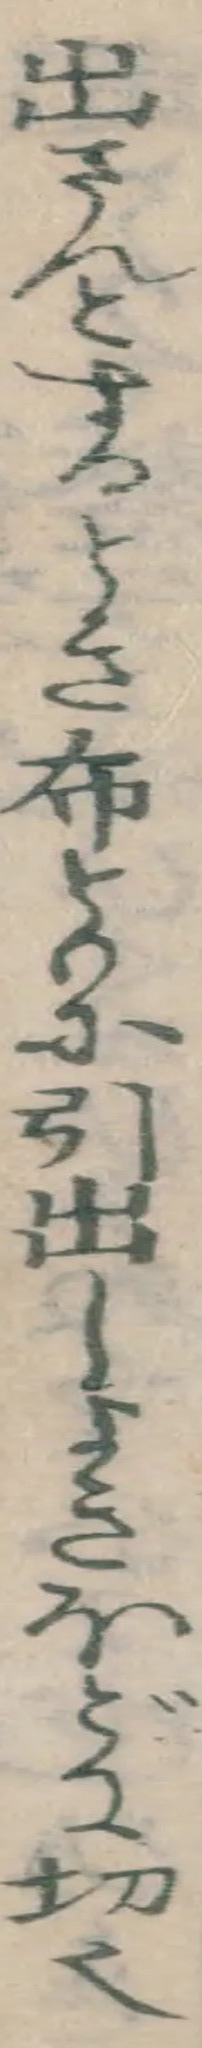出さんとするとき布ともに引出しよきほどに切也
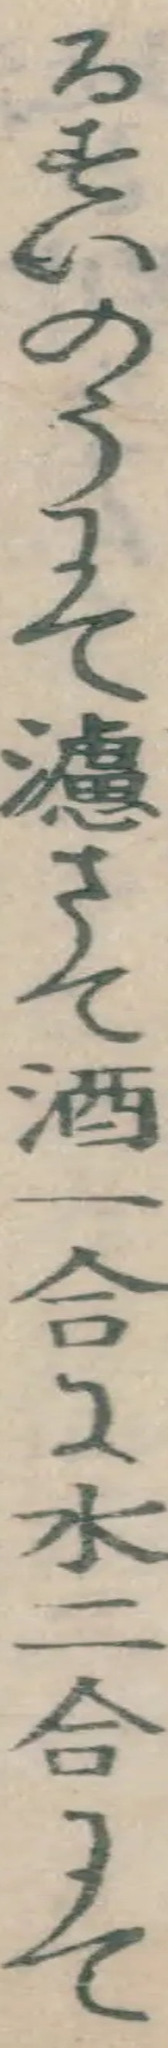るすいのうにて濾さて酒一合に水二合にて
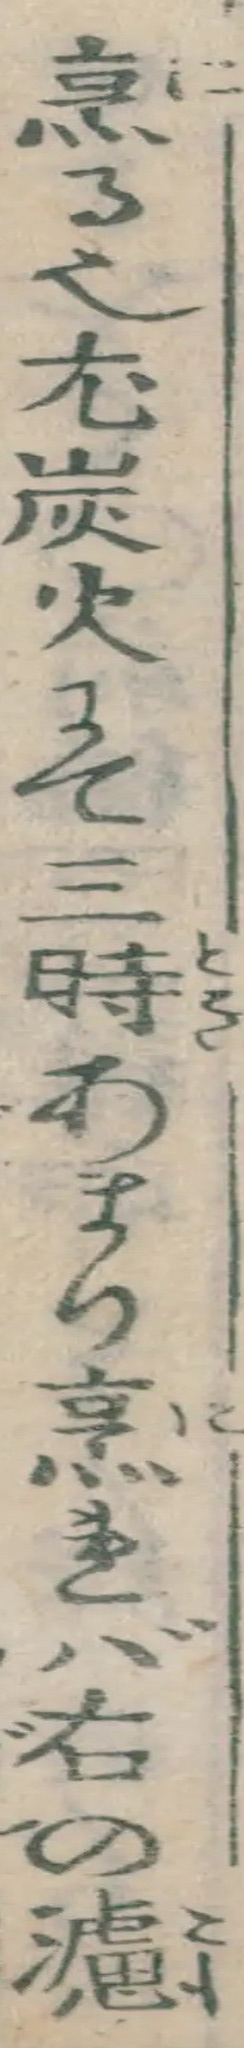烹る也尤炭火にて三時あまり烹れば右の濾
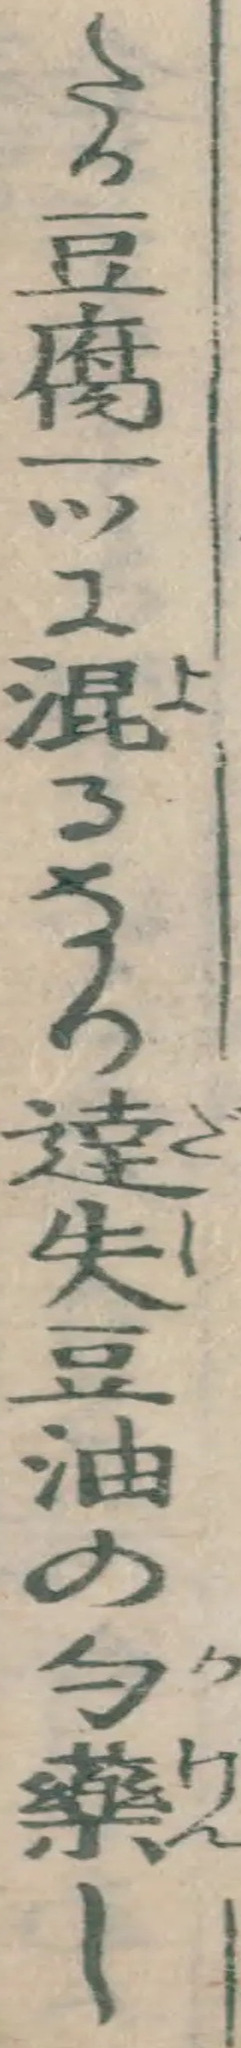たる豆腐一つに混るなり達失豆油の勺薬し

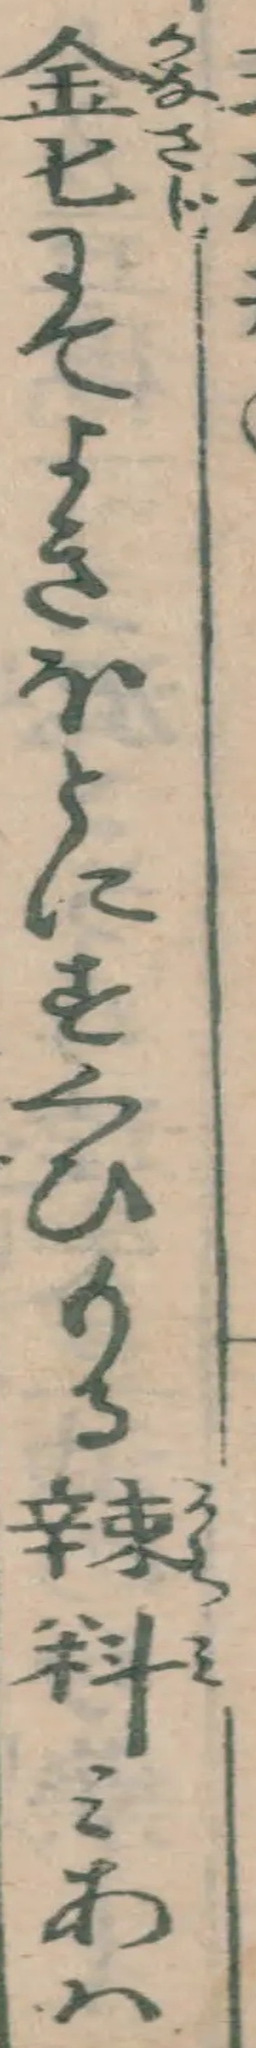金匕にてよきほとにすくひもる辣料みあは
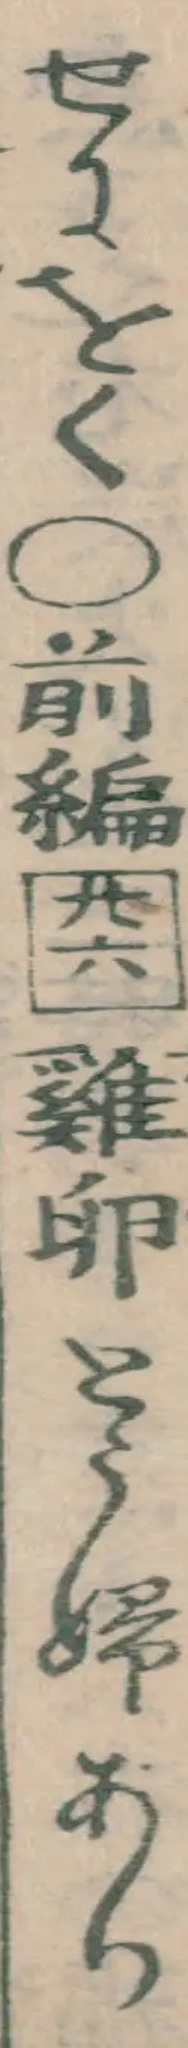せにをく○前編廿六鶏卵とうふあり
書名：豆腐百珍. 続編
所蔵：国立国会図書館 National Diet Library, JAPAN
